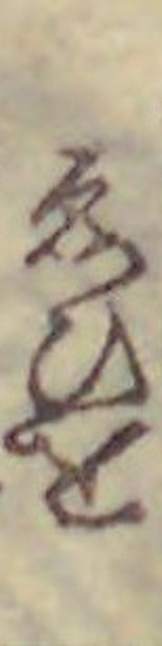ゑひを
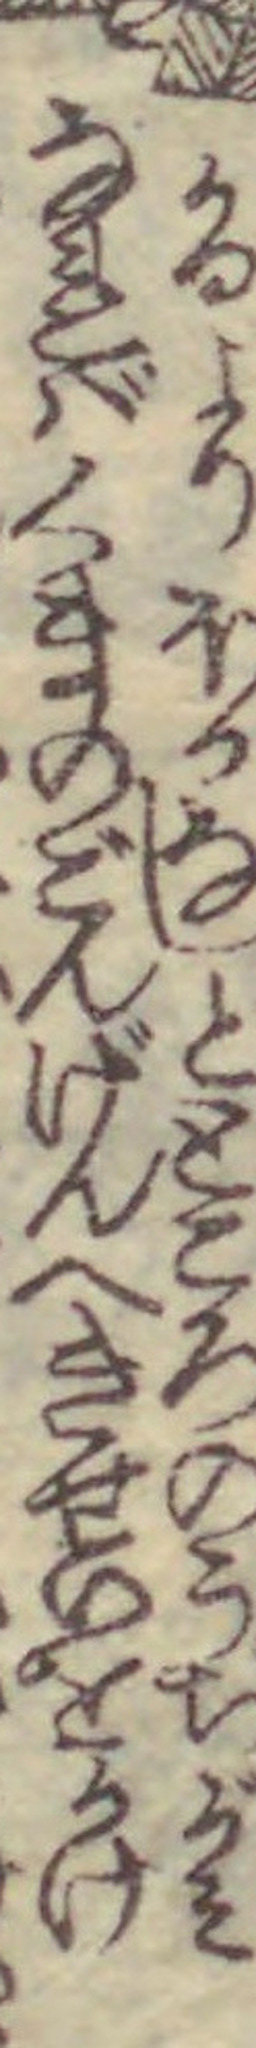なればくまのごんげんへきせいをかけ
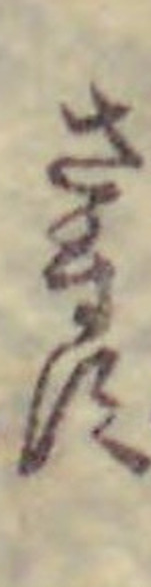さます
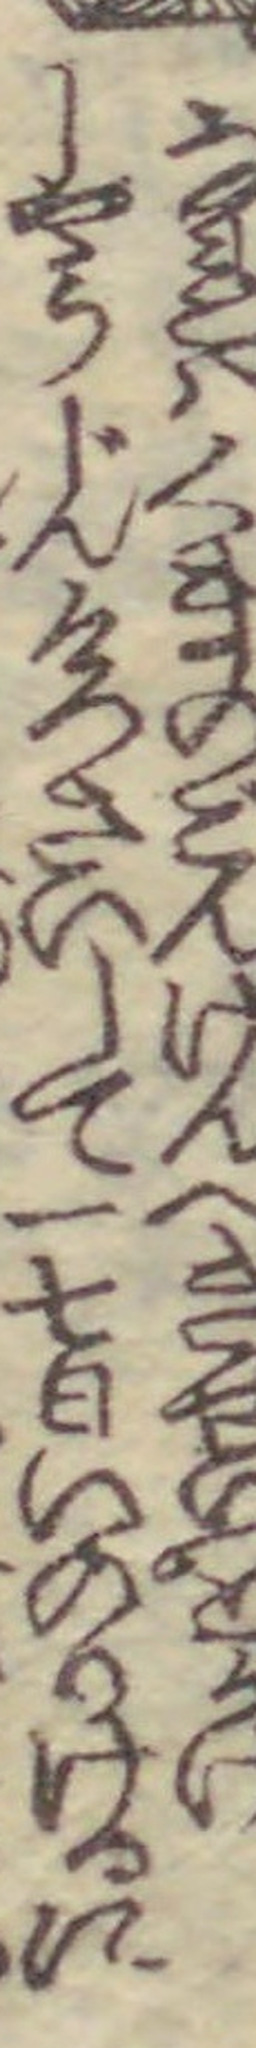しやうじんけつさいして一七日いのりけるに
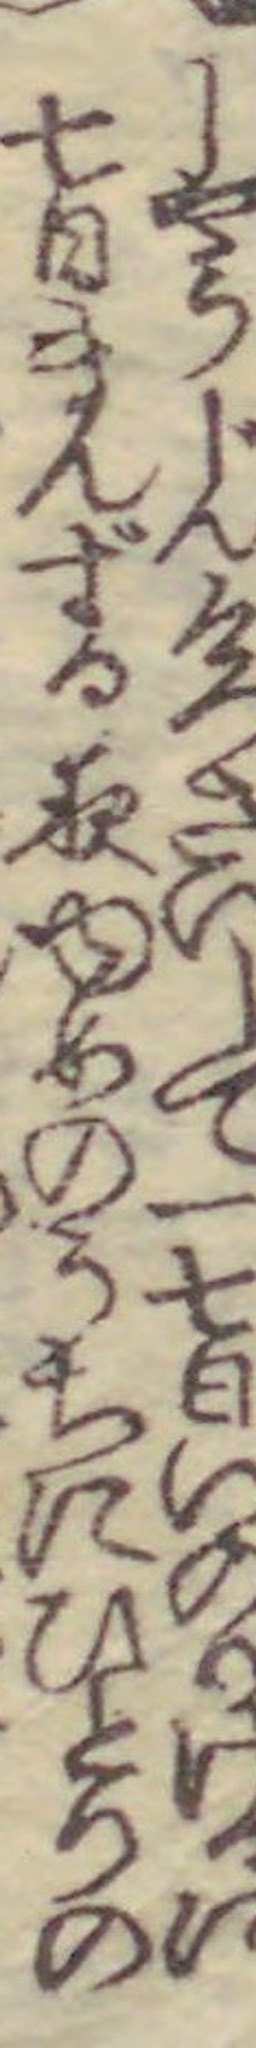七日まんずる夜ゆめのうちにひとりの
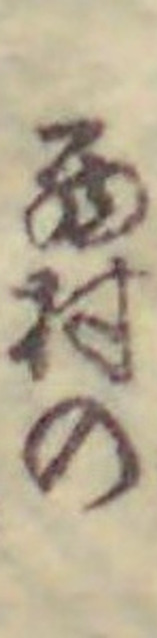西村の
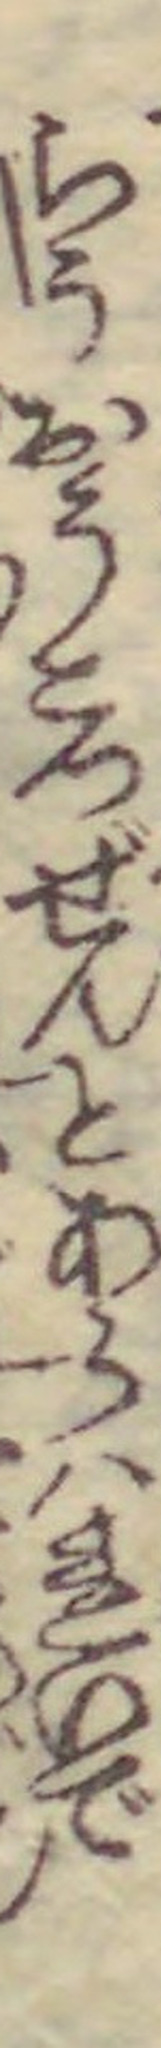らうおうこつぜんとあらはれいで
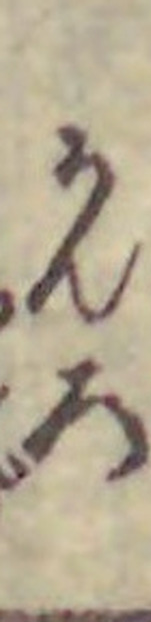かんろ
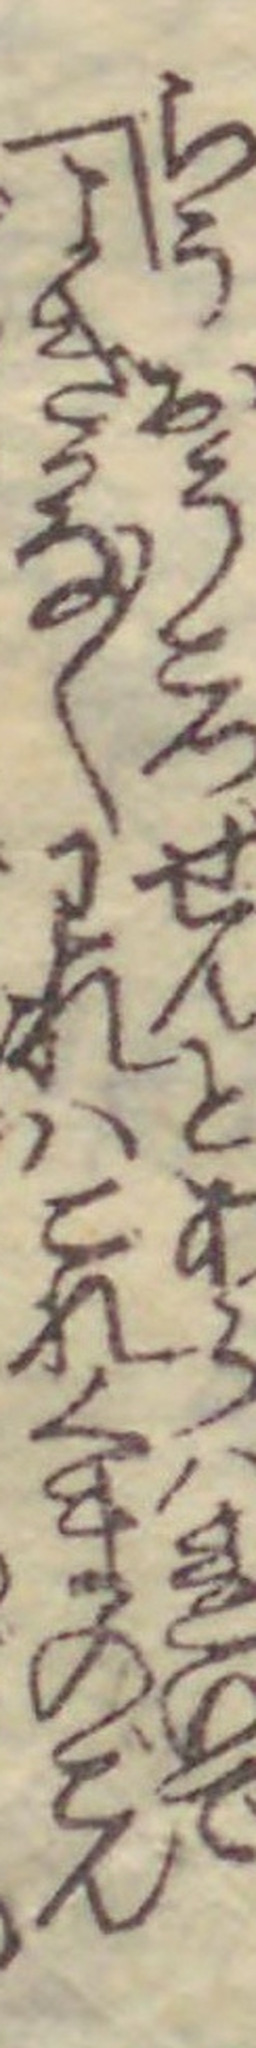〽よきかな〳〵われはこれくまのごん
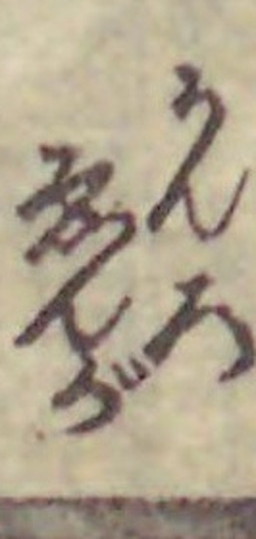ゑんが
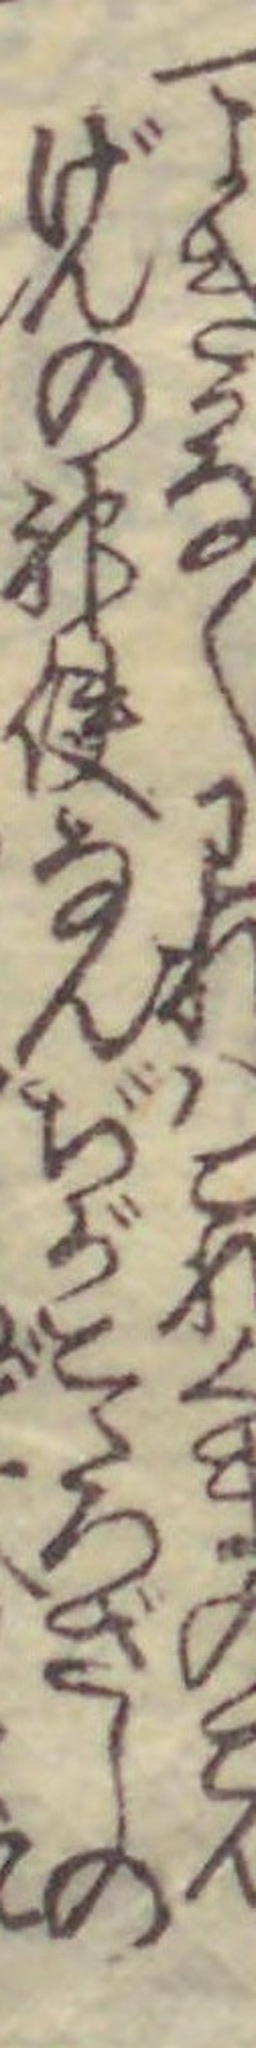げんの神使なんぢがこゝろざしの
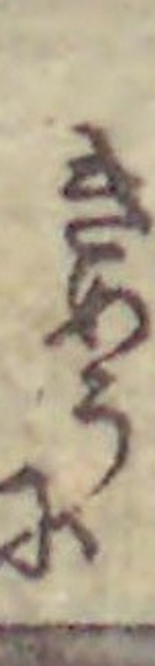きめうに
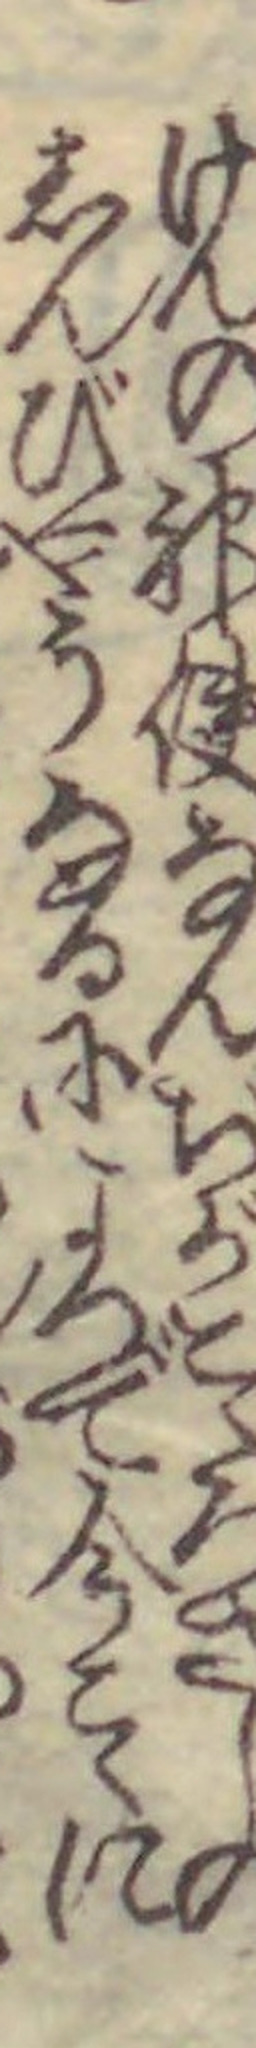しんびやうなるによつで今こゝに
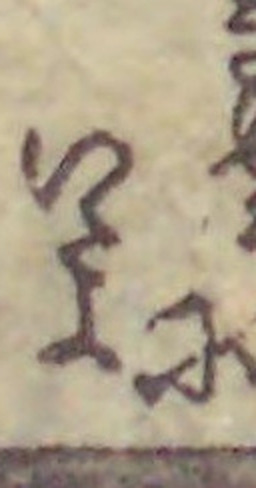いゝよ
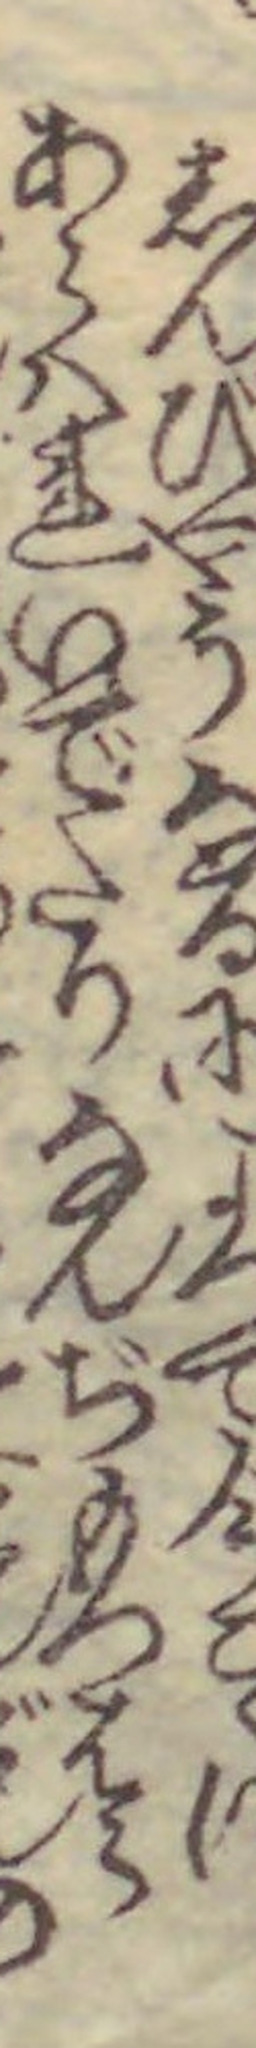あらはれいでたりなんぢもつはら
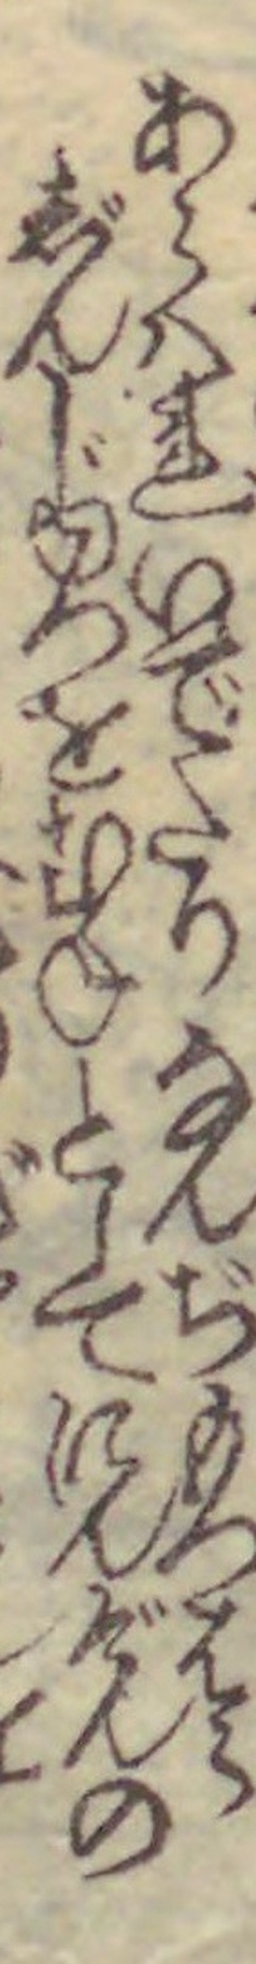じんじゆつをむねとしてにんげんの
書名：腹内窺機関 2巻
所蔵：国立国会図書館 National Diet Library, JAPAN
